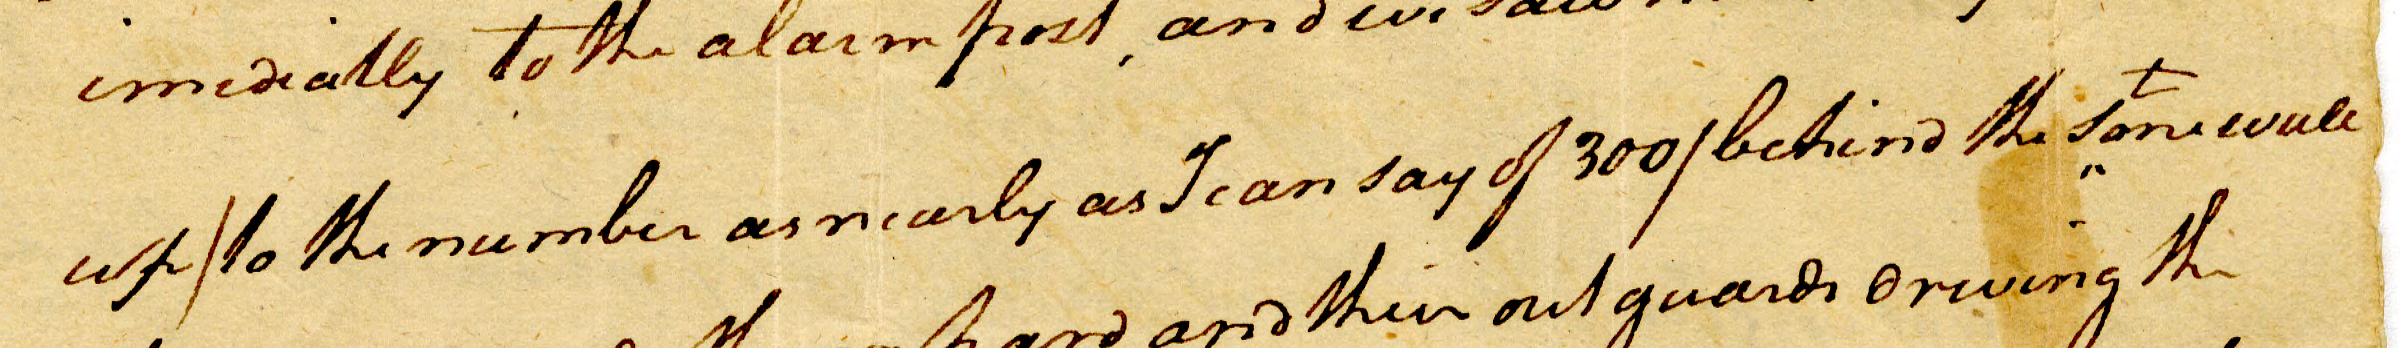up (to the number as nearly as I can say of 300) behind the s^tone wall
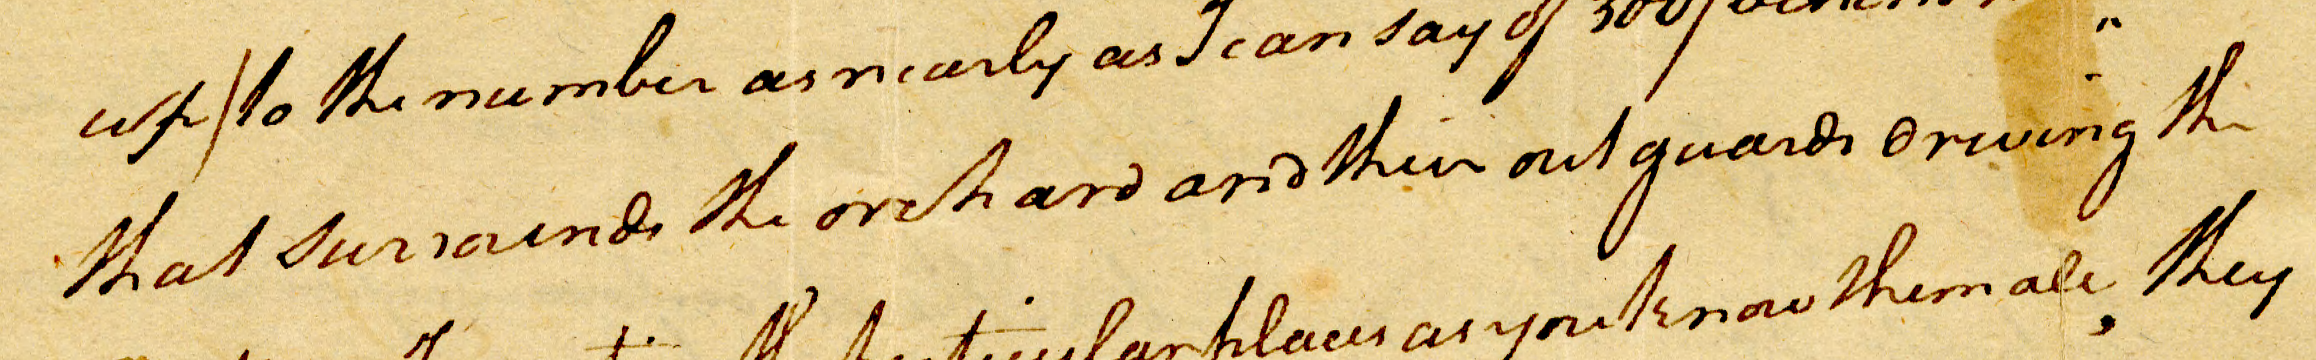that surrounds the orchard and then out guards drawing the
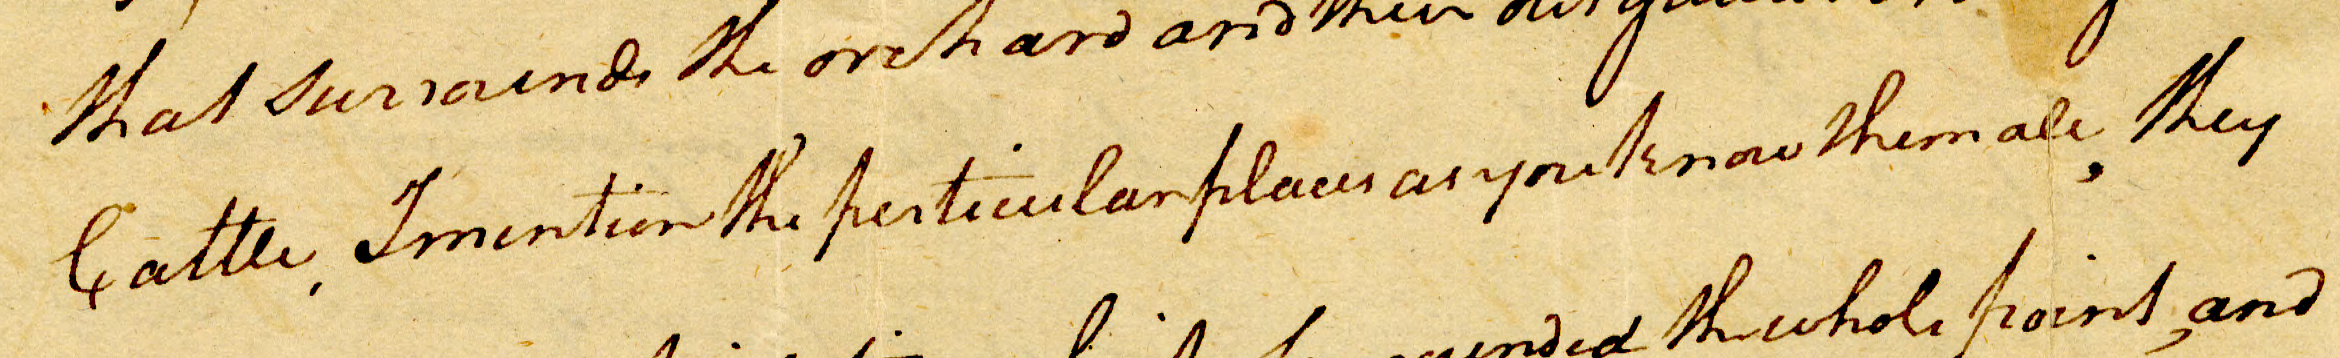Cattle, I mention the perticular places as you know them all, they
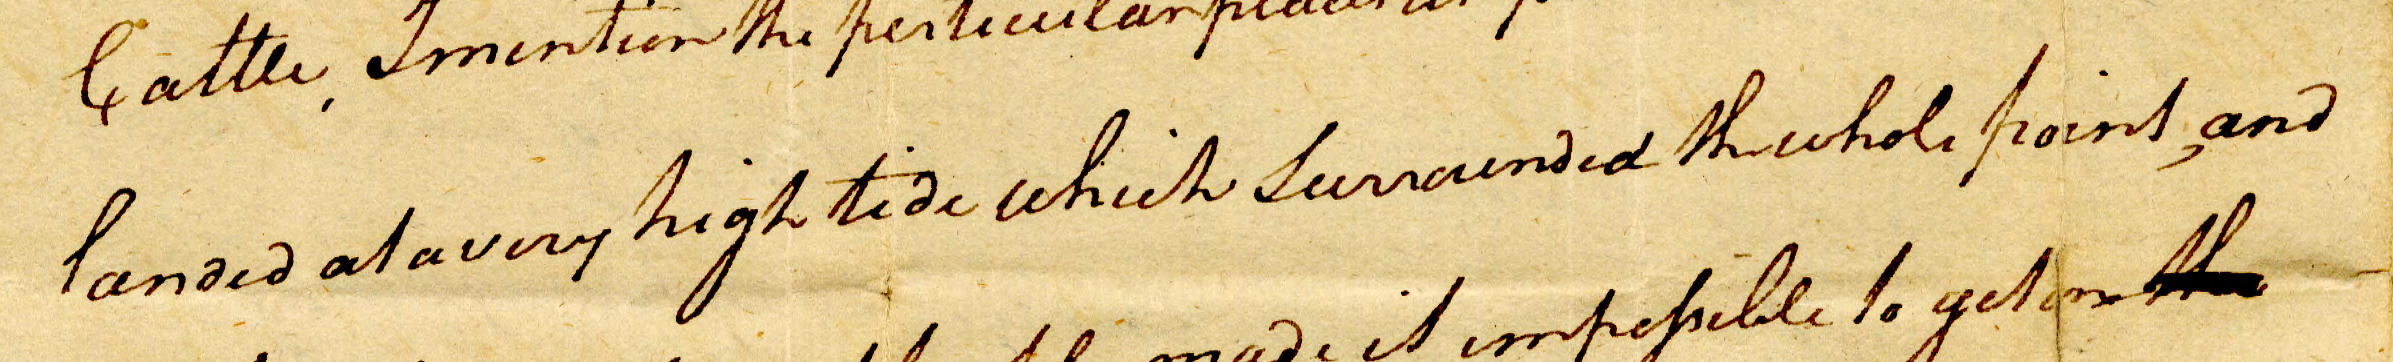landed at a very high tide which surrounded the whole point, and
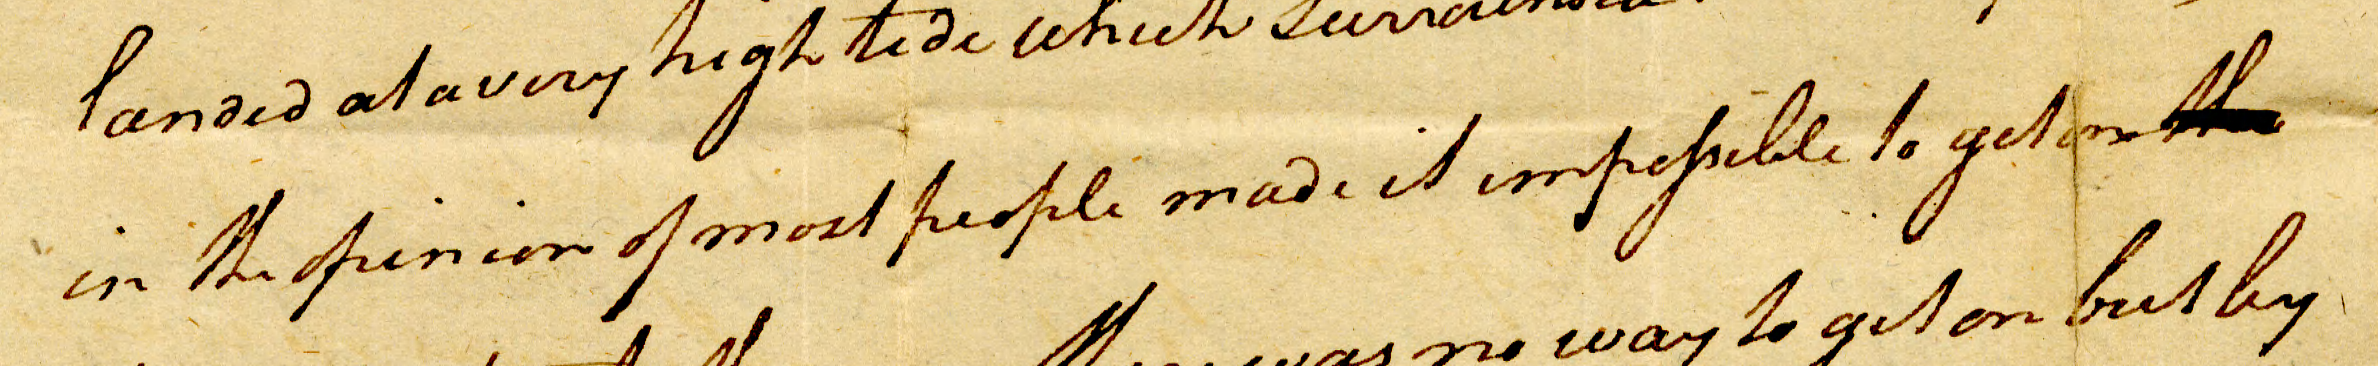in the opinion of most people made it impossible to get on [the]
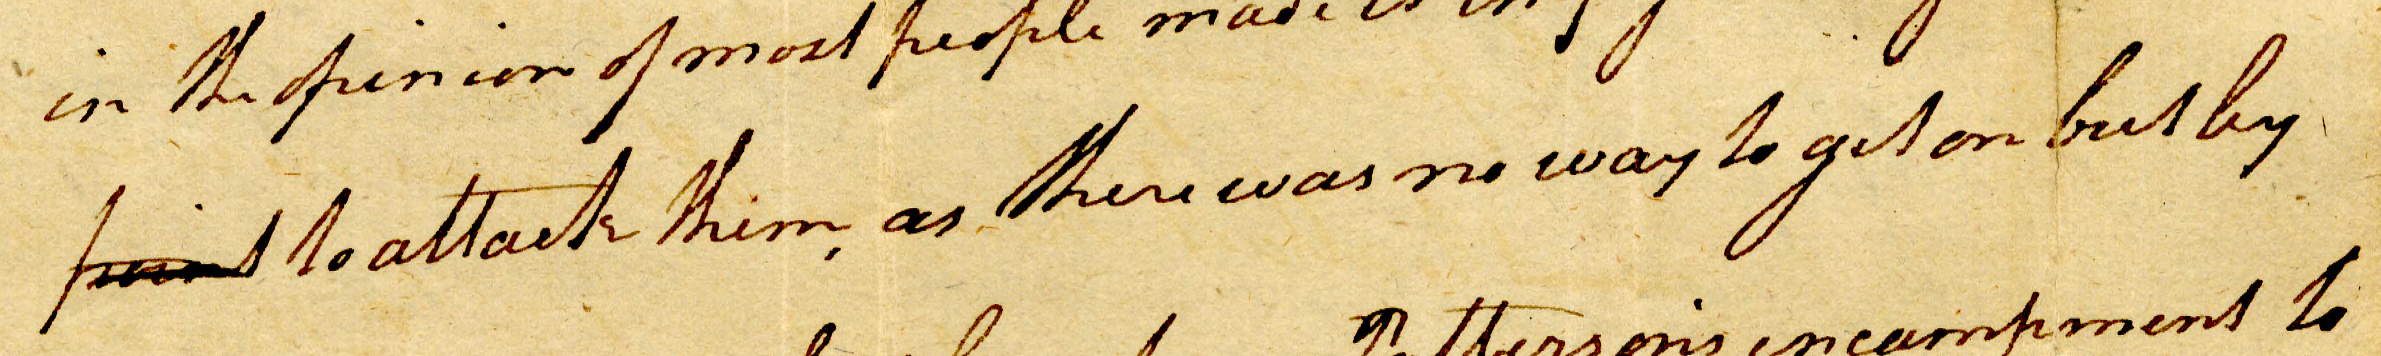[_____] to attack them, as there was no way to get on but by
